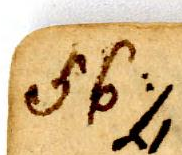56
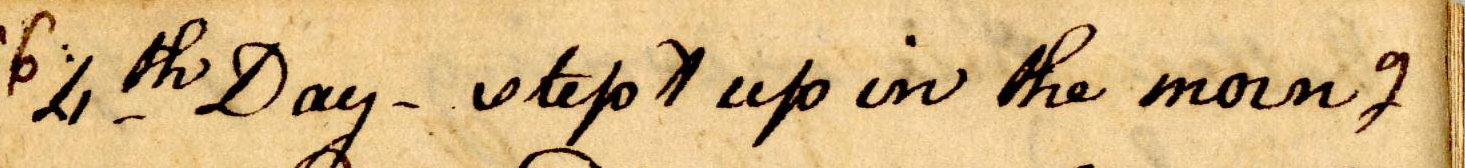4^th Day- stept up in the morn^g
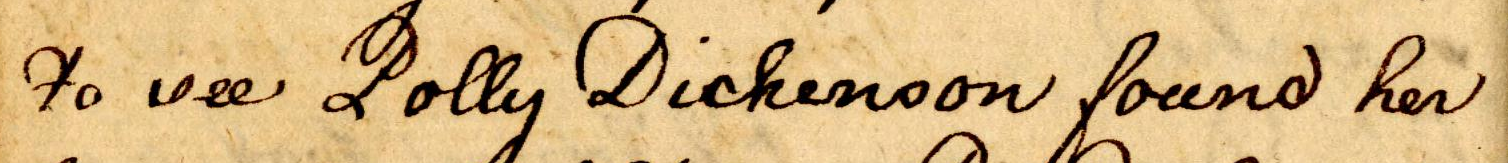to see Polly Dickenson found her
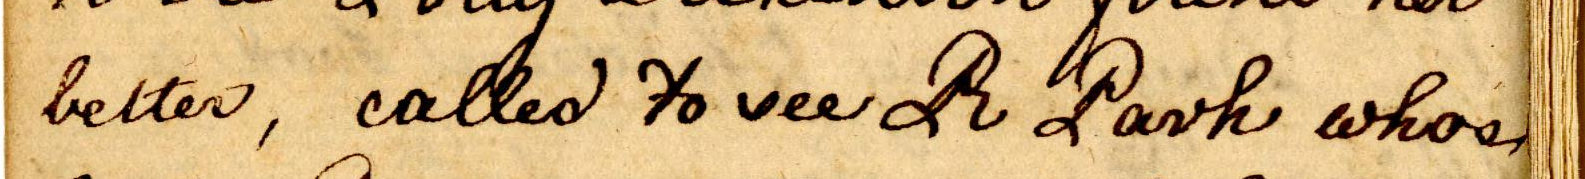better, called to see R Park whos
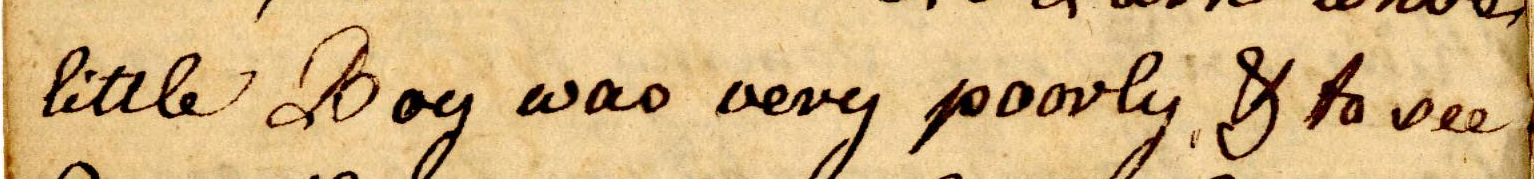little Boy was very poorly & to see
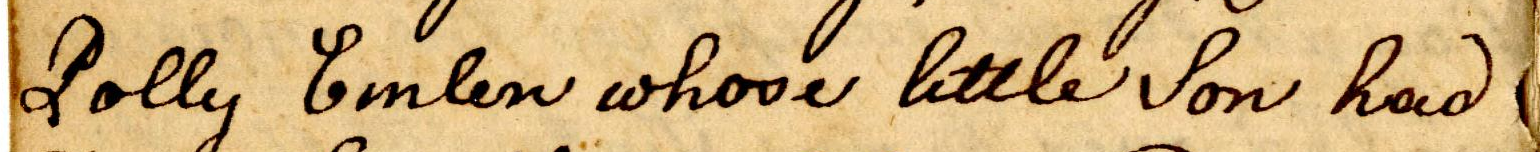Polly Emlen whose little Son had
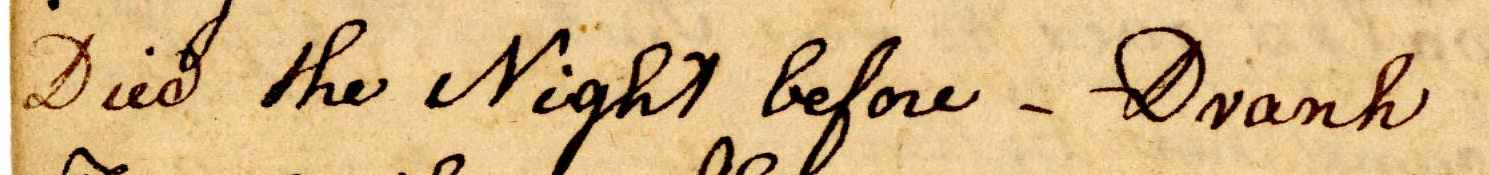Died the Night before- Drank
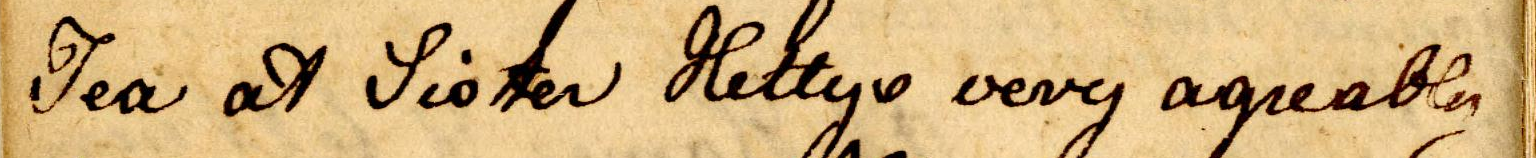Tea at Sister Hettys very agreably
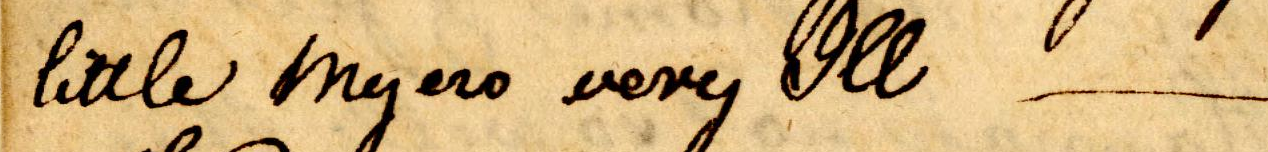little Myers very Ill-
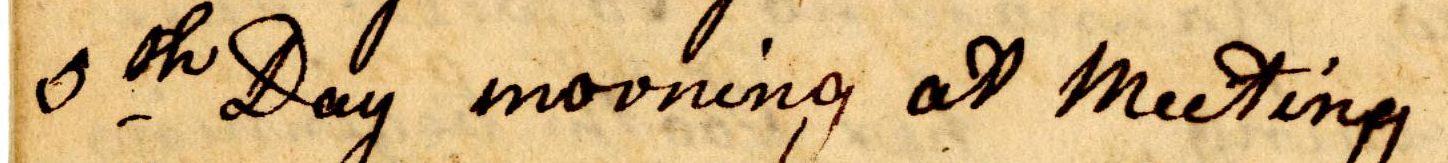5^th Day morning at Meeting
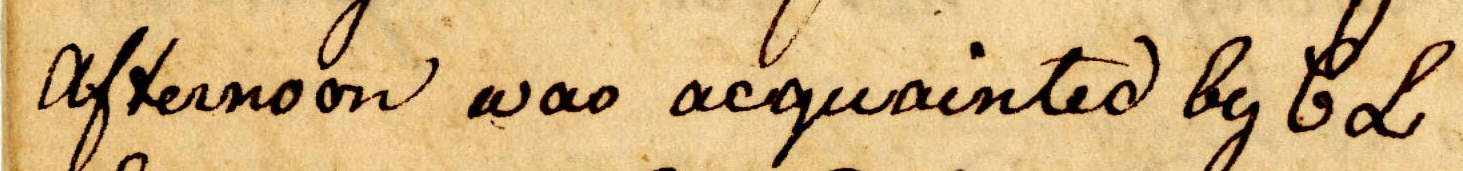Afternoon was acquainted by CL
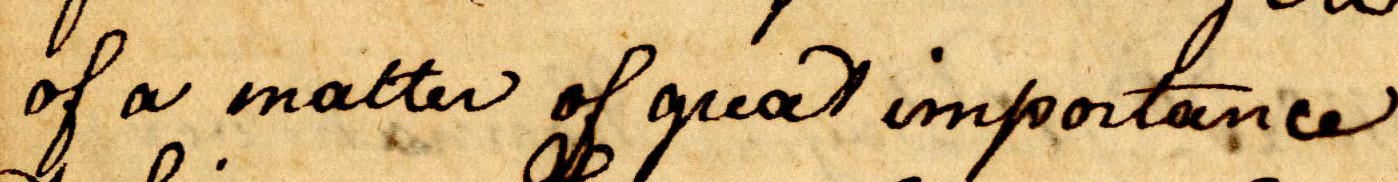of a matter of great importance
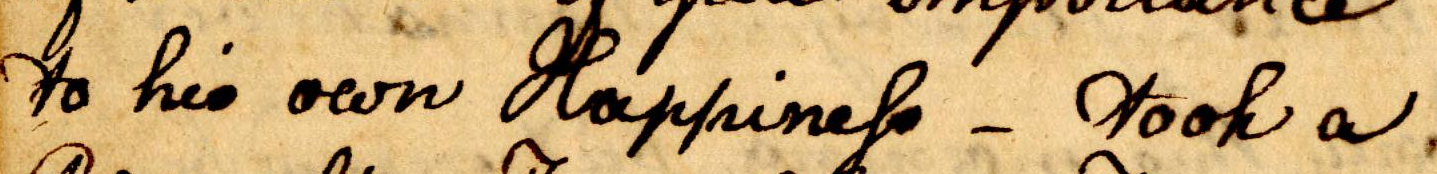to his own Happiness- took a
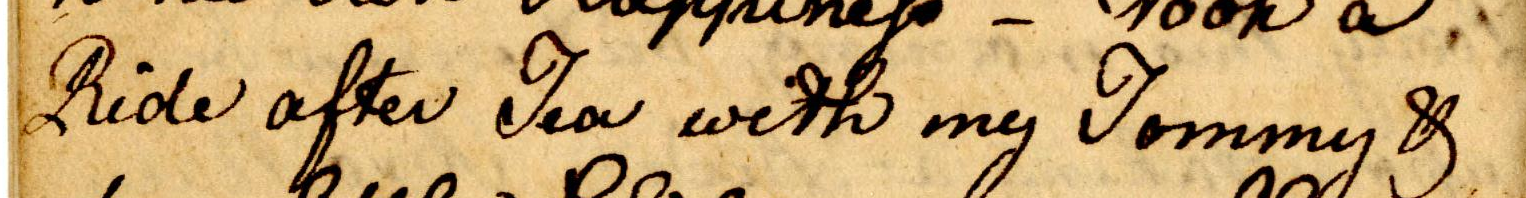Ride after Tea with my Tommy &
